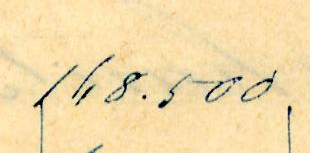168.500
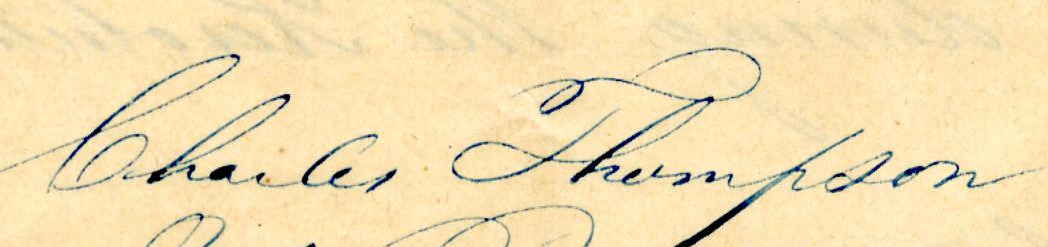Charles Thompson
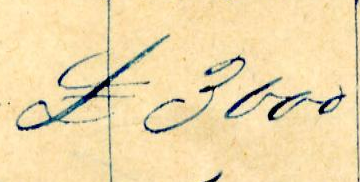£3000
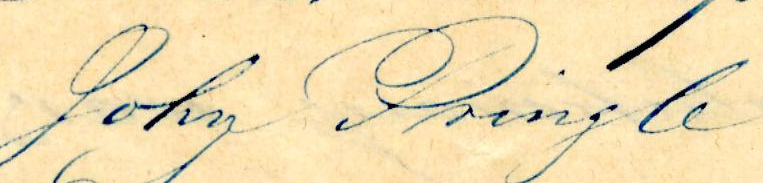John Pringle
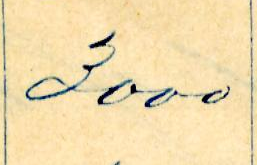3000
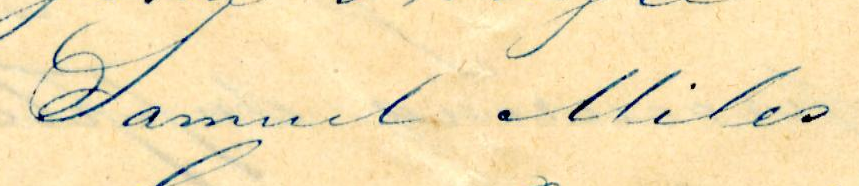Samuel Miles
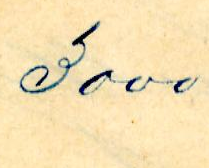3000
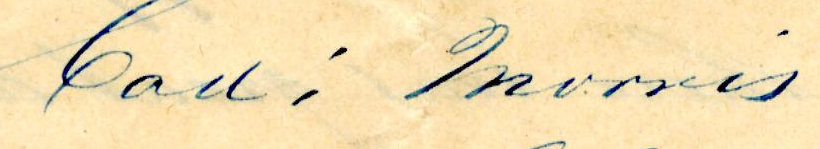Cad: Morris
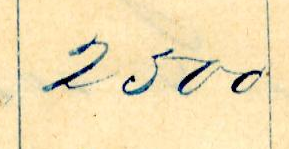2500
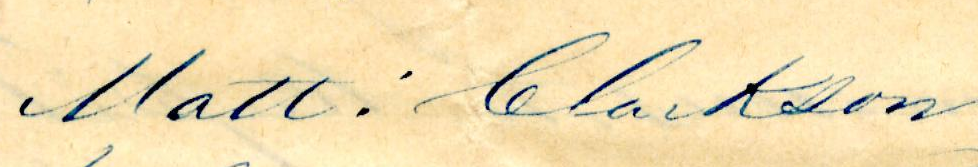Matt: Clarkson
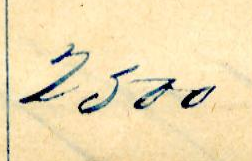2500
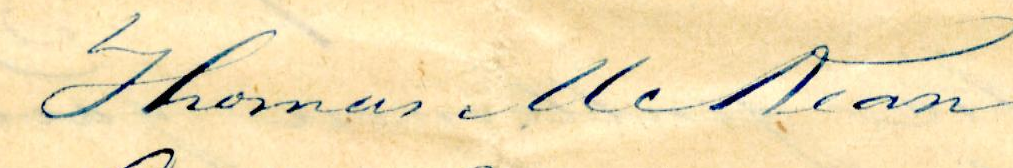Thomas McKean
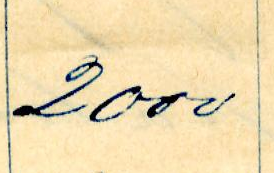2000
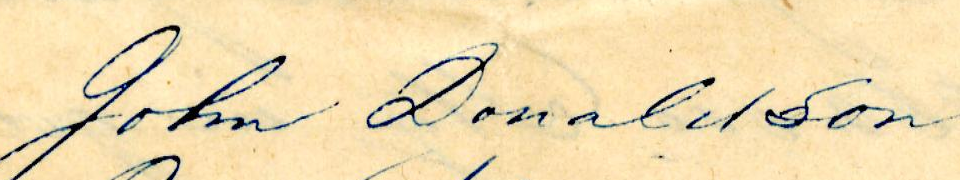John Donaldson
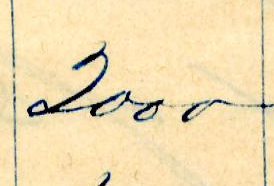2000
